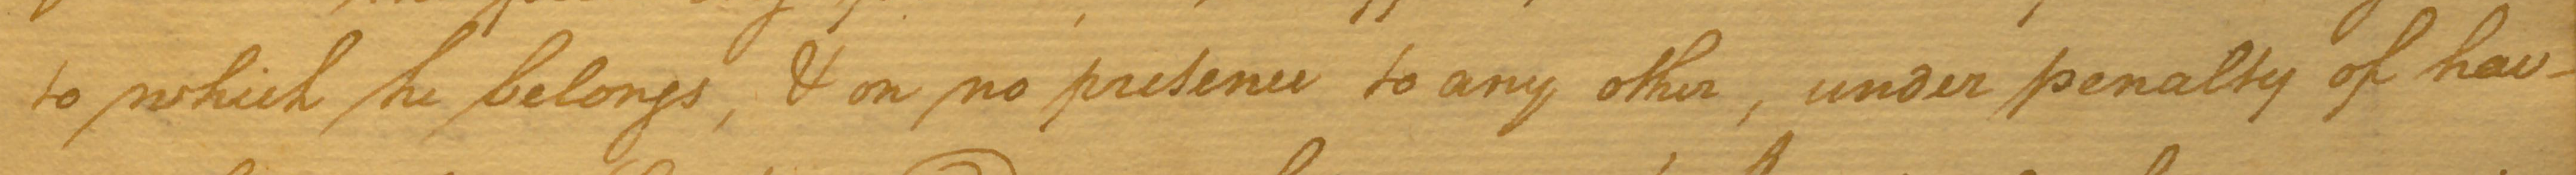to which he belongs, & on no presence to any other, under penalty of hav-
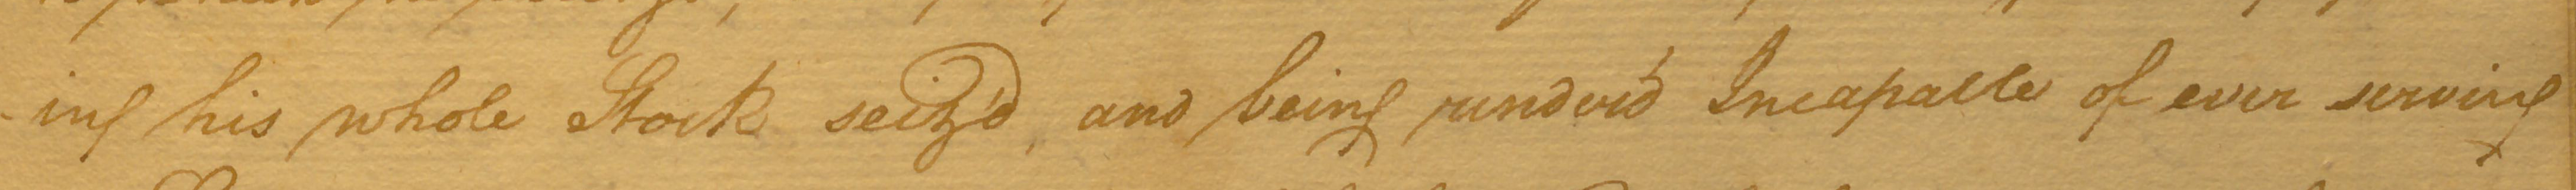-ing his whole Stock seiz'd and being render'd Incapable of ever serving
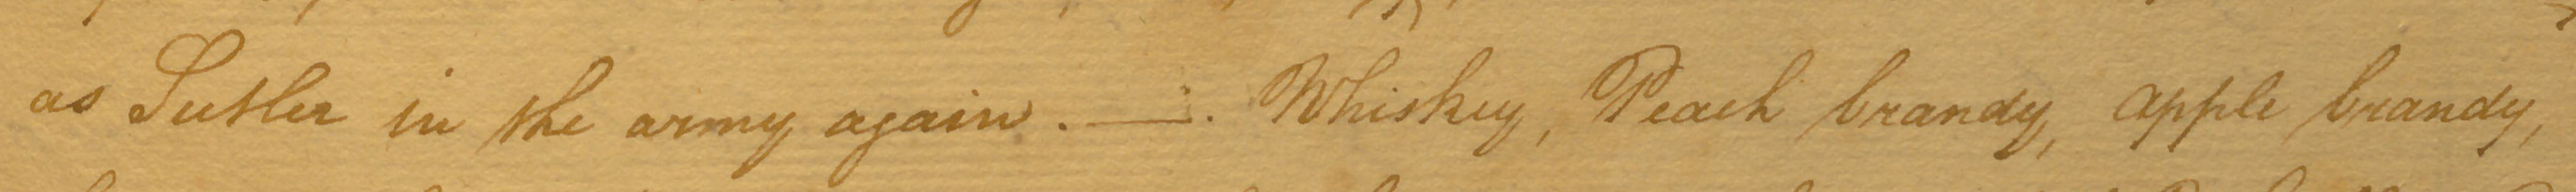as Sutler in the army again.-: Whiskey, Peach brandy, apple brandy,
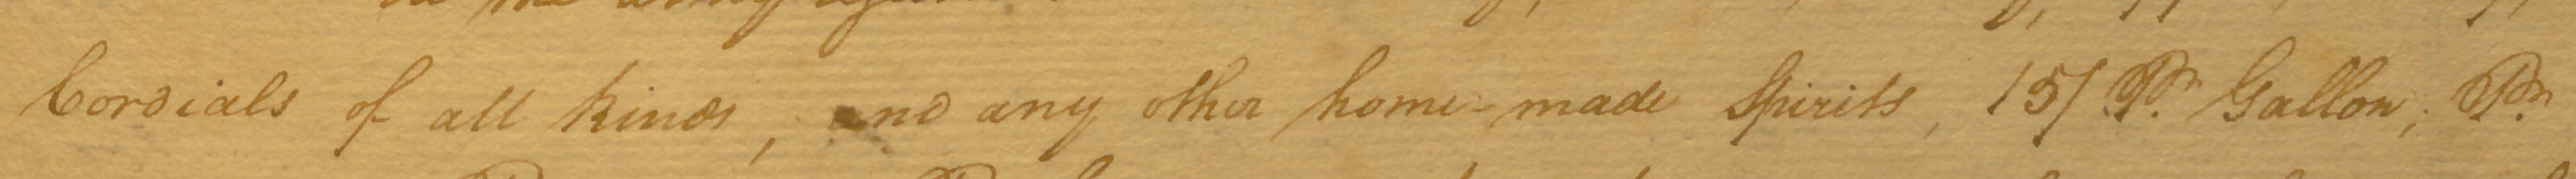Cordials of all kinds, and any other home-made spirits, 15s per Gallon, per
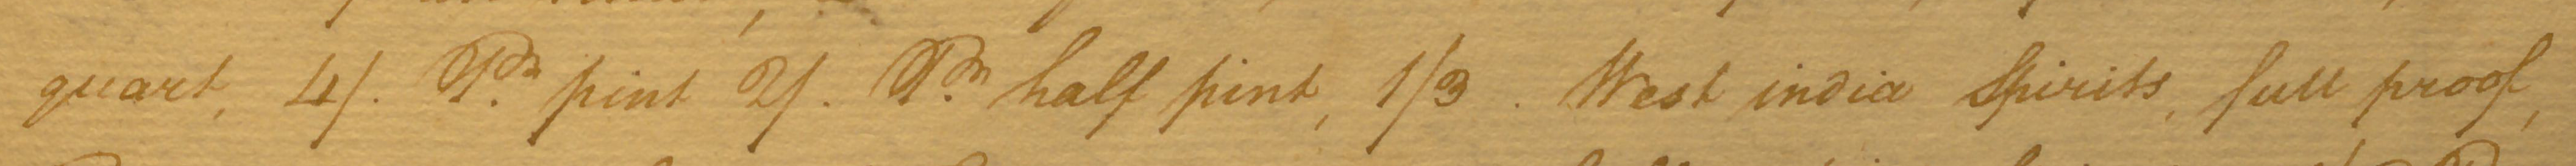quart, 4s. per pint 2s per half pint, 1s3. West india spirits full proof,
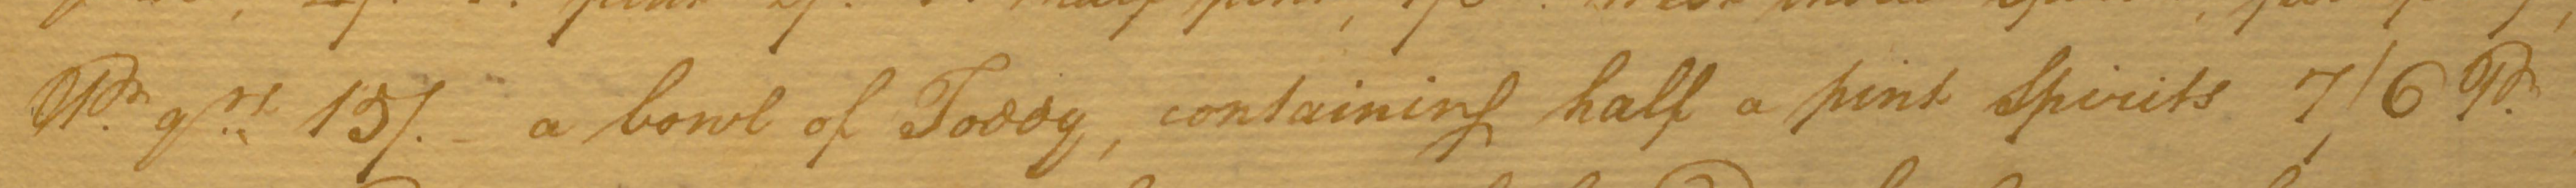per q^rt. 15s a bowl of Toddy, containing half a pint spirits 7s6 per.
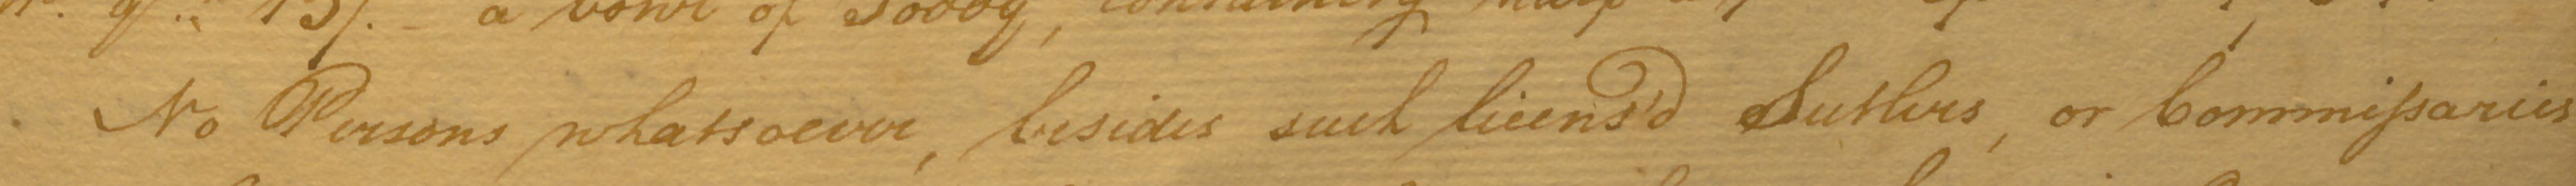No Persons whatsoever, besides such licens'd Suthers, or Commissaries
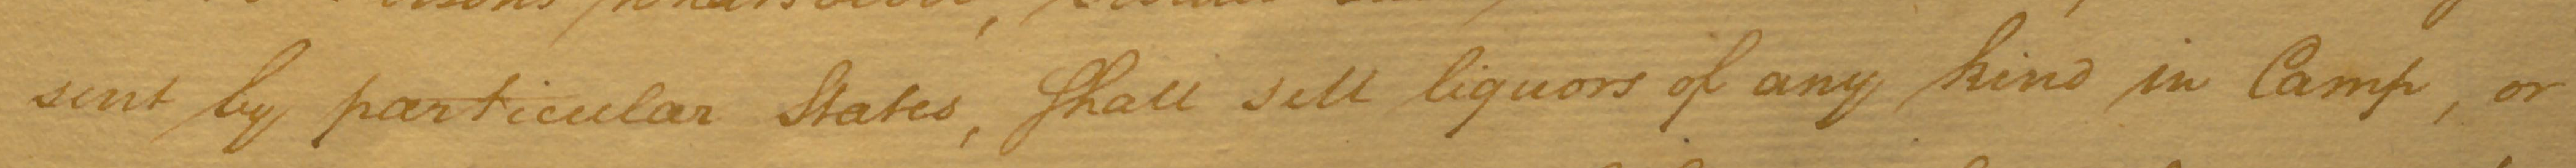sent by particular states, shall sell liquors of any kind in Camp, or
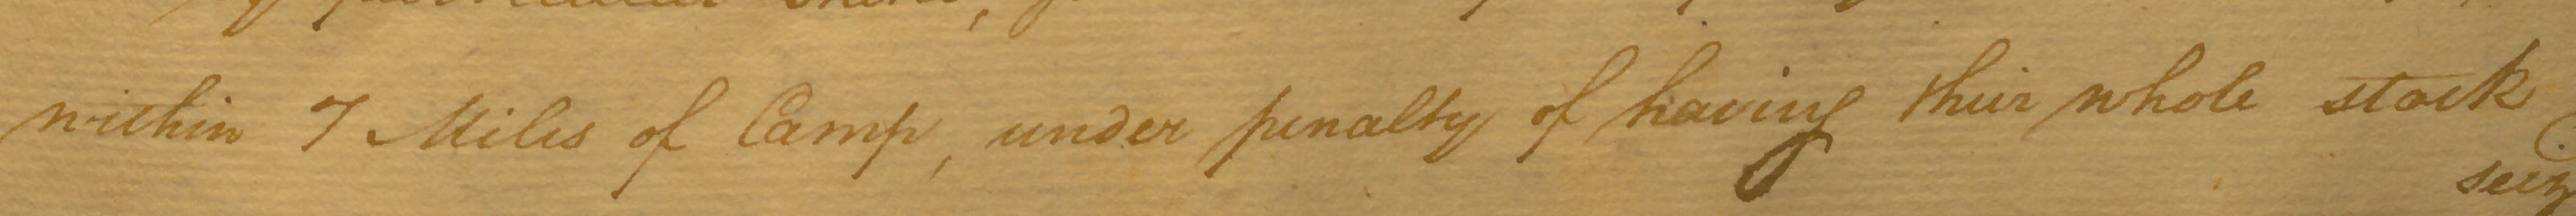within 7 Miles of Camp, under penalty of having their whole stock
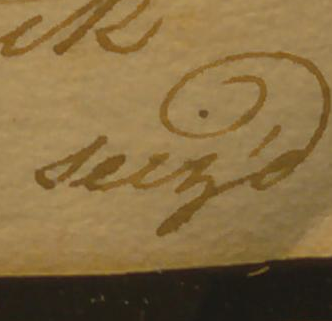seiz'd
